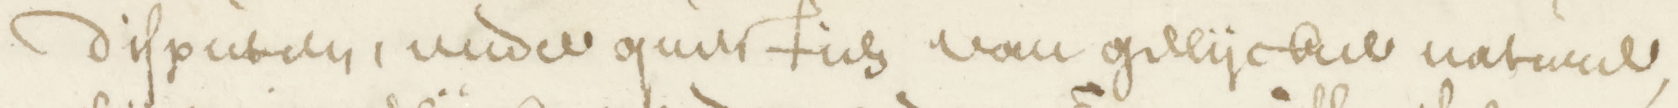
disputen, ende questien van gelijcke nature,
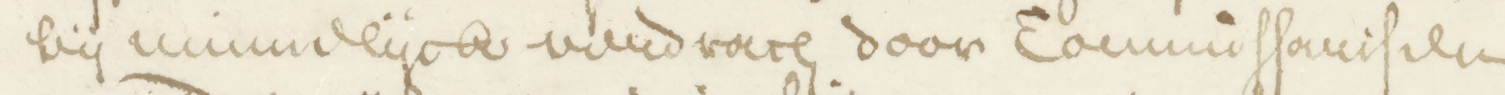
bij minnelijck verdrach door Commissarisen
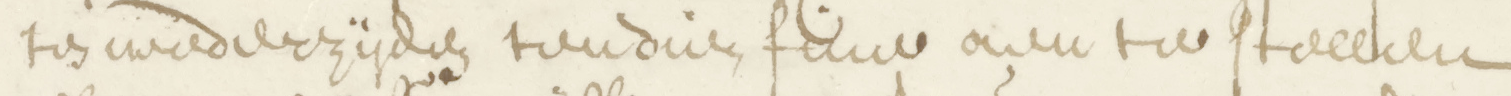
ten wederzijden tendien fine aen te stellen,
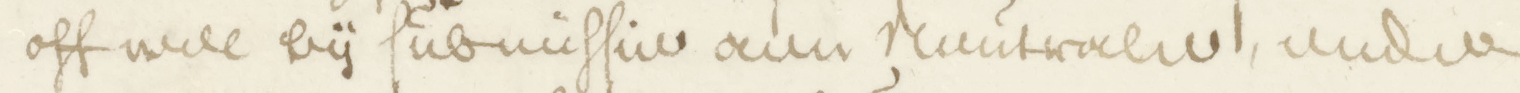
off wel bij submissie aen Neutrale, ende
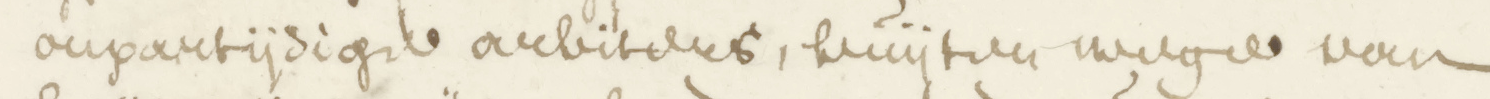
onpartijdige arbiters, buijten wege van
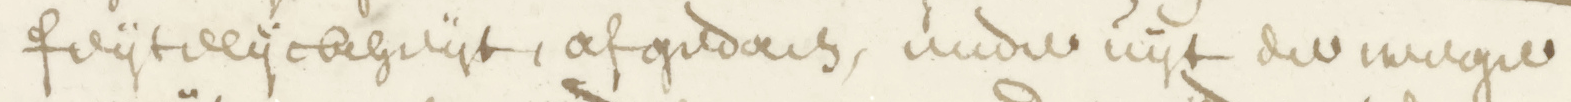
feijtelijckheijt, afgedaen, ende uijt de wege
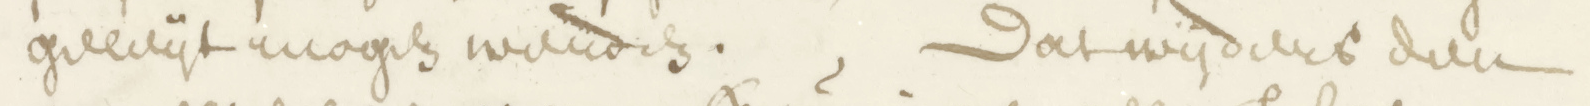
geleijt mogen werden. Dat wijders den
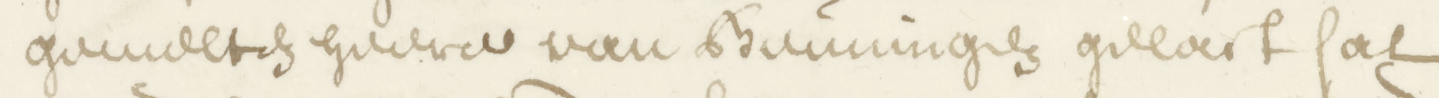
gemelten heere van Beuningen gelast sal
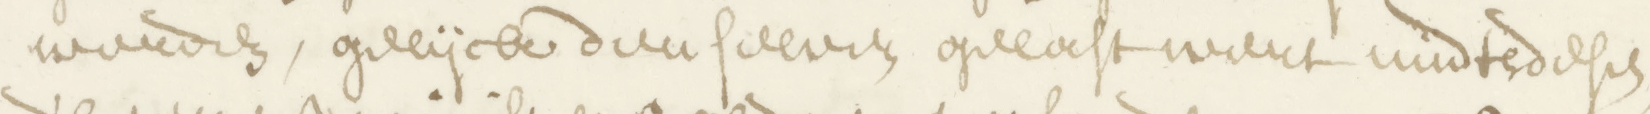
werden, gelijck den selven gelast wert midtsdesen,
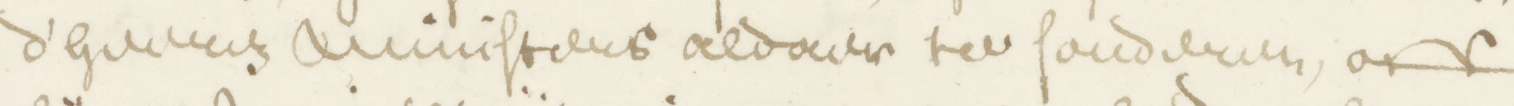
d'heeren Ministers aldaer te sonderen, off
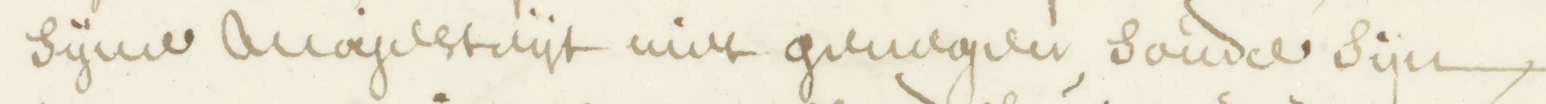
Sijne Majesteijt niet genegen soude sijn,
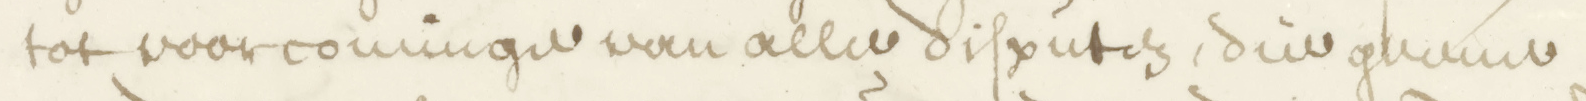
tot voorcominge van alle disputen, die geene
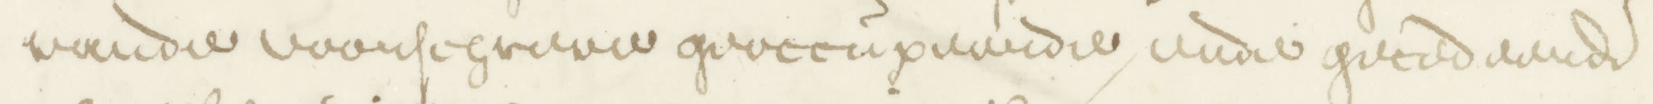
vande voorschreve geoccupeerde, ende gecedeerde
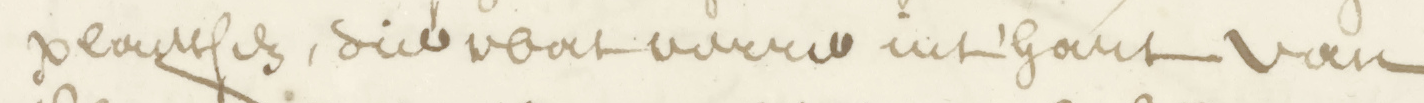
plaetsen, die wat verre int' hart van
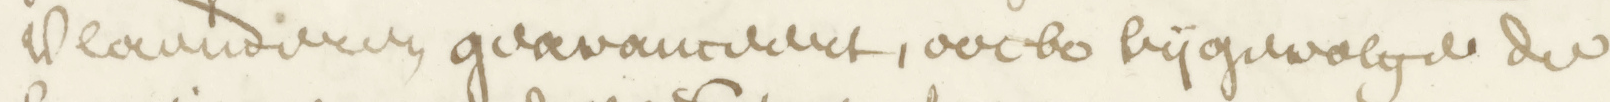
Vlaenderen geavanceert, oock bijgevolge de
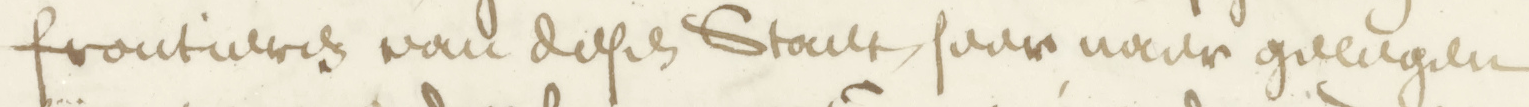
frontieren van desen Staet, seer naer gelegen
